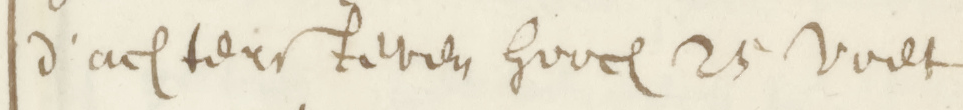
d'achtersteven hooch 25 voet
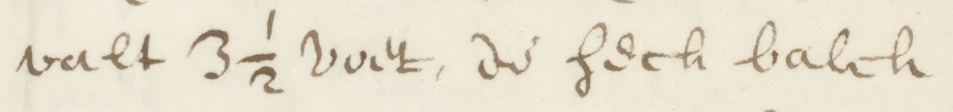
valt 3½ voet, de heck balck
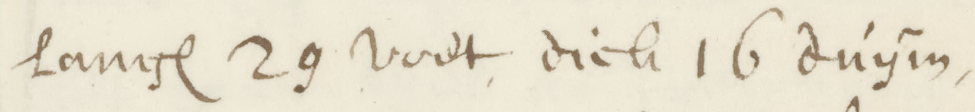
langh 29 voet, dick 16 duijm,
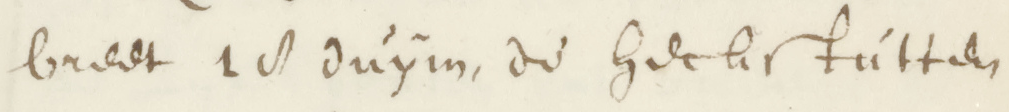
breet 18 duijm, de heckstutten
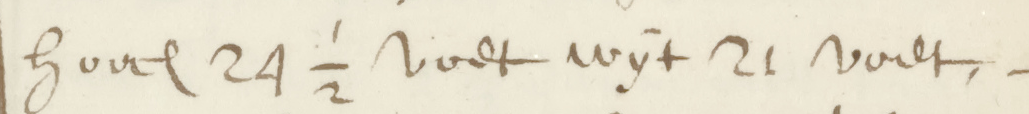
hooch 24½ voet wijt 21 voet,
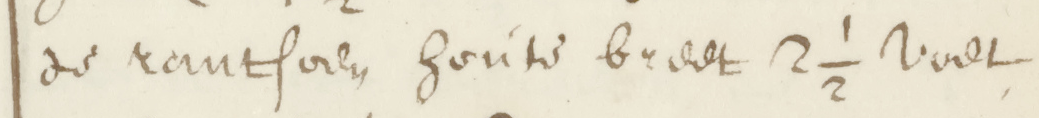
de rantsoen houte breet 2½ voet,
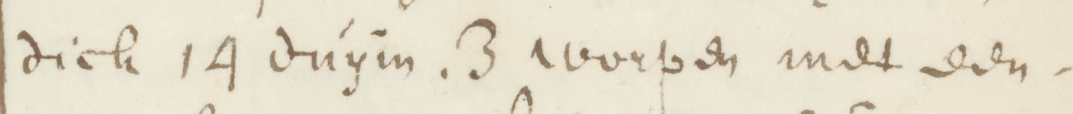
dick 14 duijm. 3 worpen met een
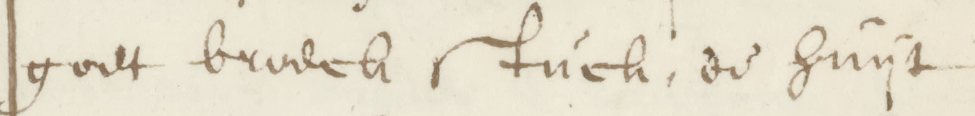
goet broeck stuck, de huijt
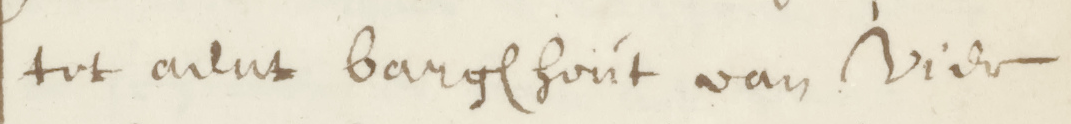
tot aent barghhout van vier
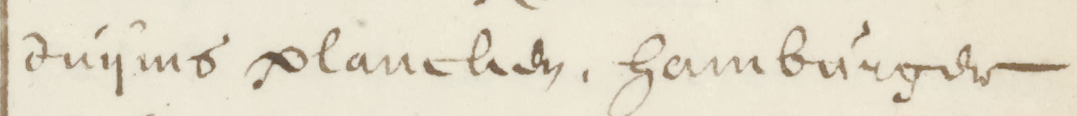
duijms plancken, Hamburger
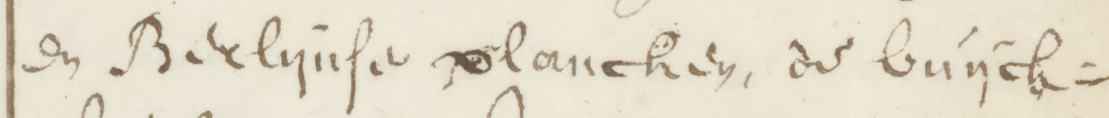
en Berlijnse plancken, de buijck=
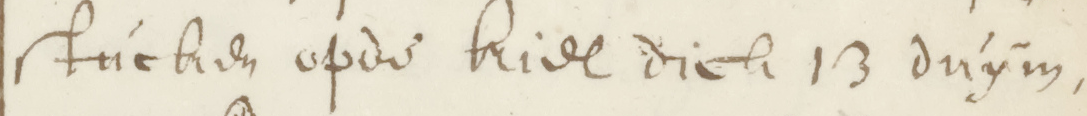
stucken opde kiel dick 13 duijm,
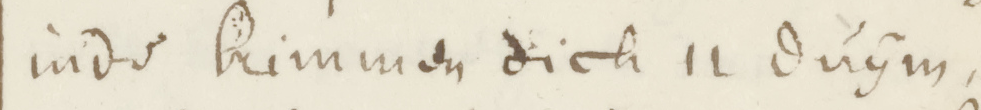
inde kimmen dick 11 duijm,
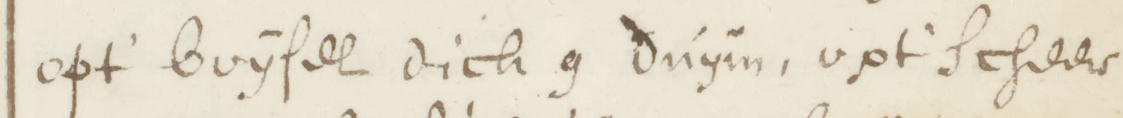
opt' boijsel dick 9 duijm, opt' scheer
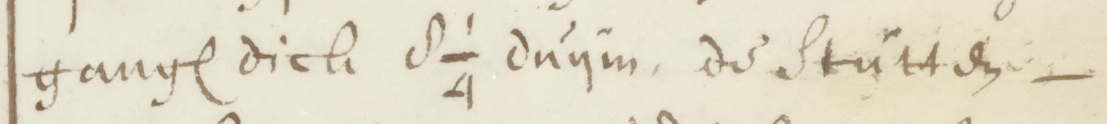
gangh dick 8¼ duijm, de stutten
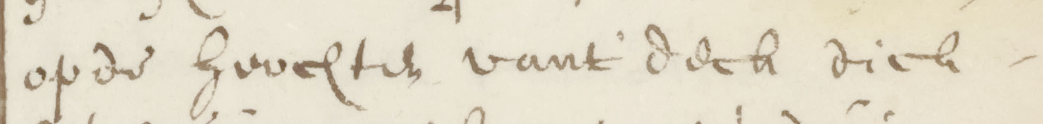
opde hoochten vant‛ deck dick
